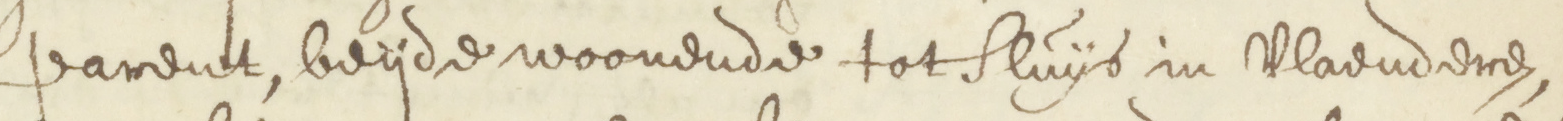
Parent, beijde woonende tot sluijs in Vlaenderen,
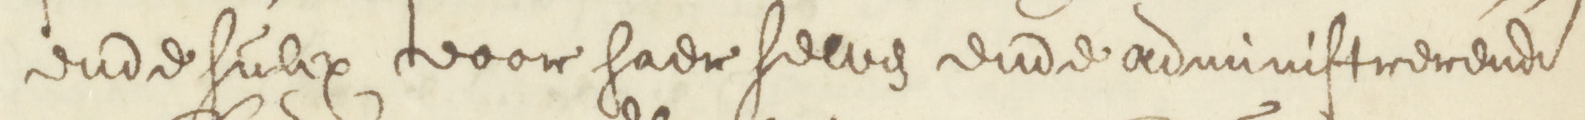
ende sulcx voor haer selven ende administrerende
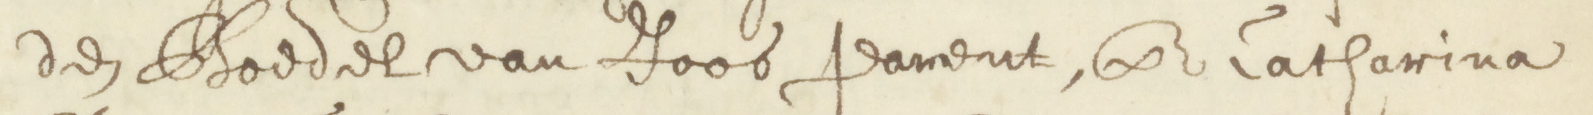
den Boedel van Joos Parent, & Catharina
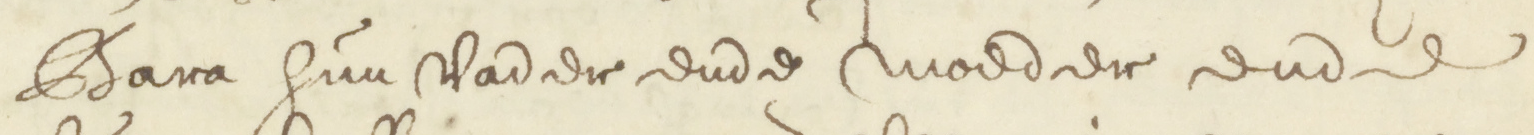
Bara hun vader ende moeder ende
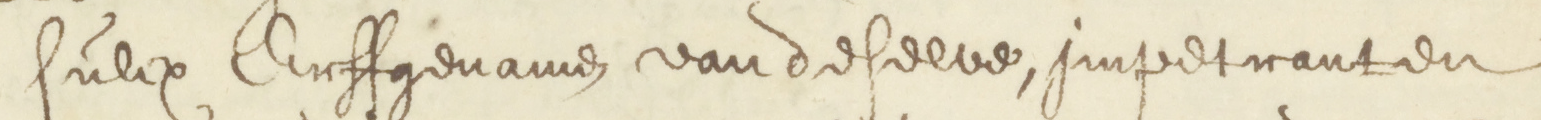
sulcx Erffgenamen van deselve, impetranten
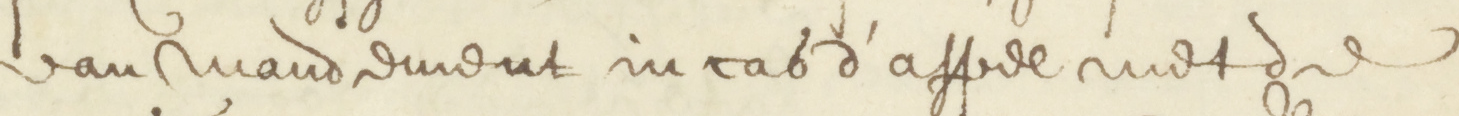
van mandement incas d'appel met de
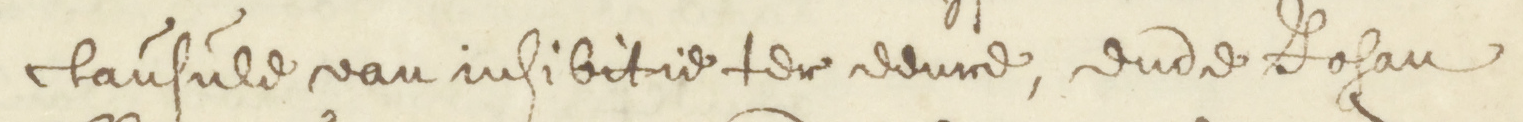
clausule van inhibitie ter eenre, ende Johan
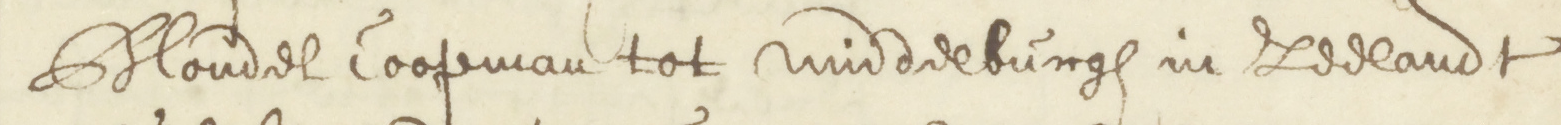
Blondel coopman tot Middelburgh in Zeelandt
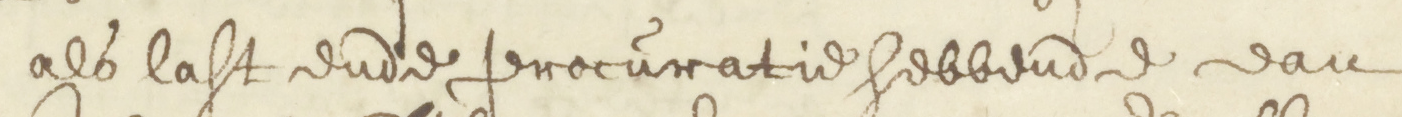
als last ende procuratie hebbende van
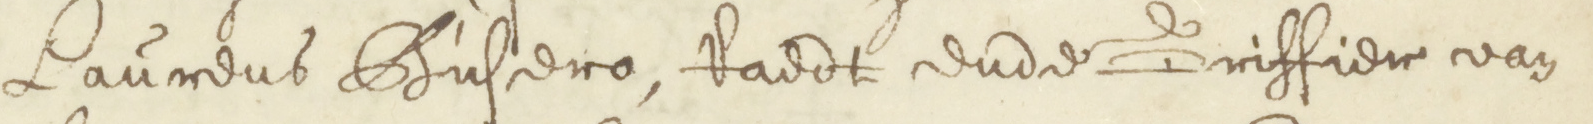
Laurens Busero, Raedt ende Griffier van
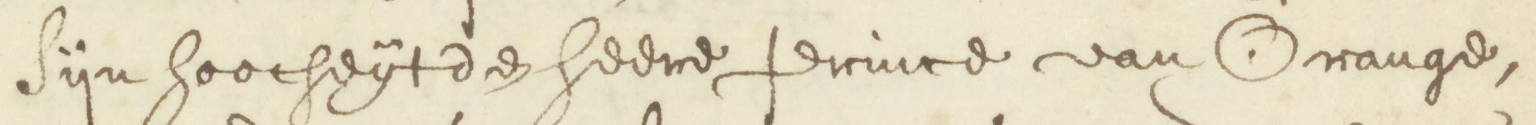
sijn hoocheijt de heere Prince van Orange,
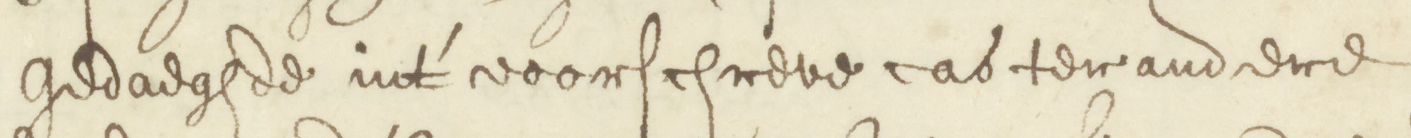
gedaeghde int' voorschreve cas ter andere
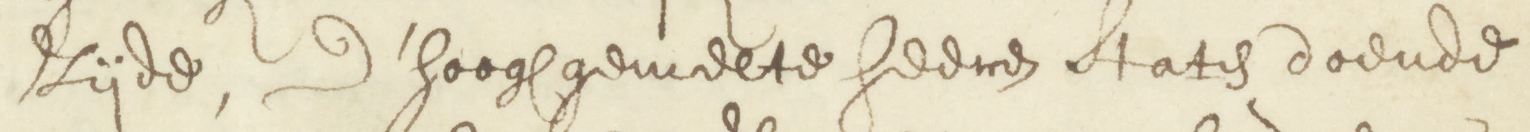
zijde de D'hooghgemelte heeren staten doende
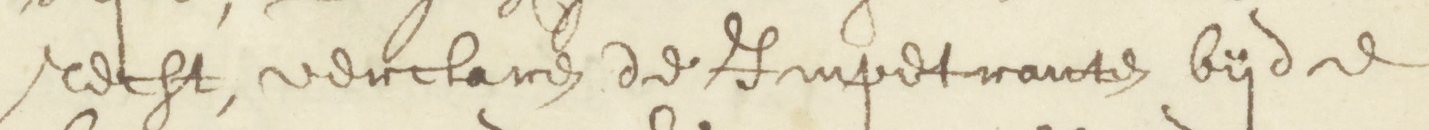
recht, verclaren de Impetranten bijde
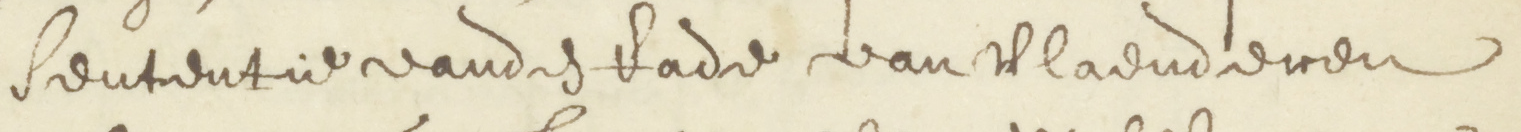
sententie vanden Rade van Vlaenderen
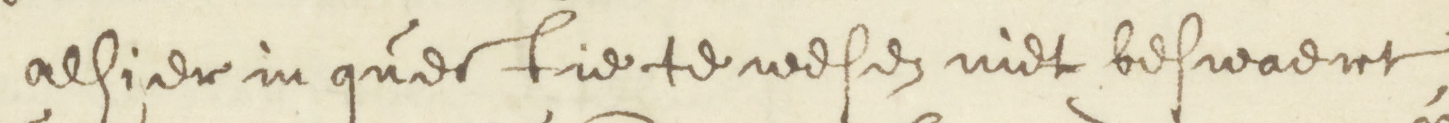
alhier in questie te wesen niet beswaert,
